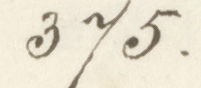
375.
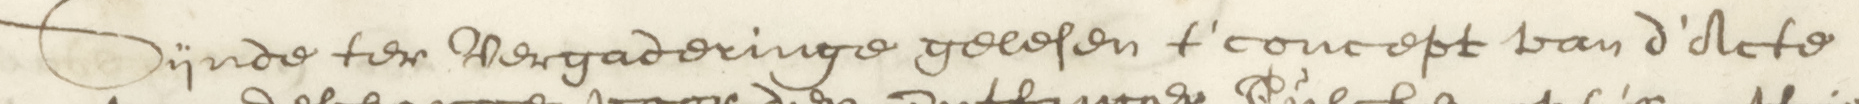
Sijnde ter Vergaderinge gelesen t'concept van d'Acte
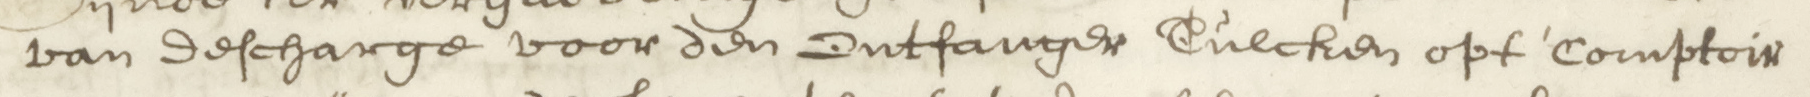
van Descharge voor den Ontfanger Tulcken opt' Comptoir
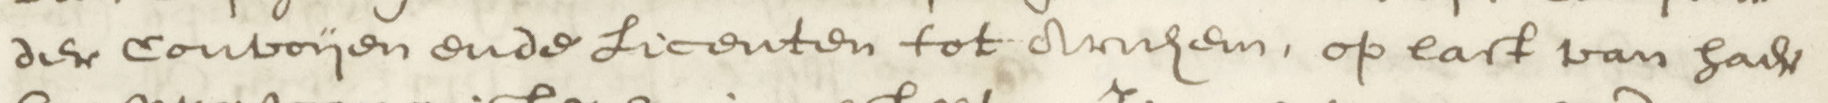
der Convoijen ende Licenten tot Arnhem, op last van haer
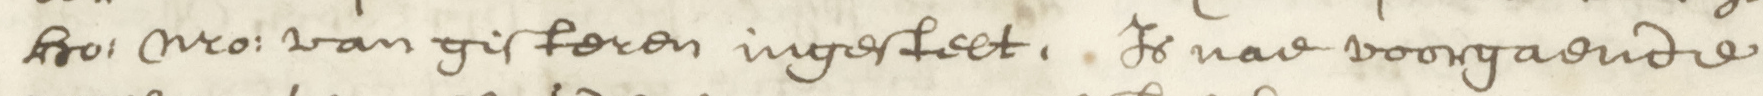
Ho:Mo: van gisteren ingestelt, Is nae voorgaende
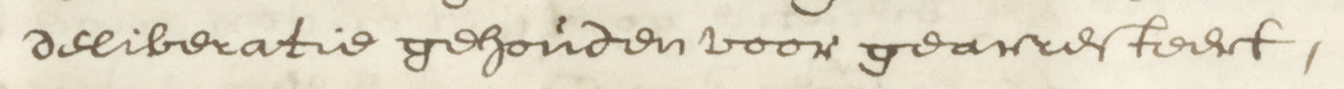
deliberatie gehouden voor gearresteert.
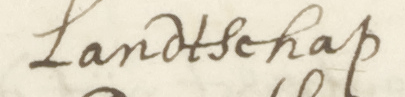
Landtschap
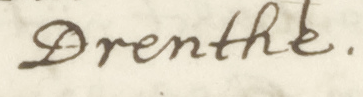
Drenthe.
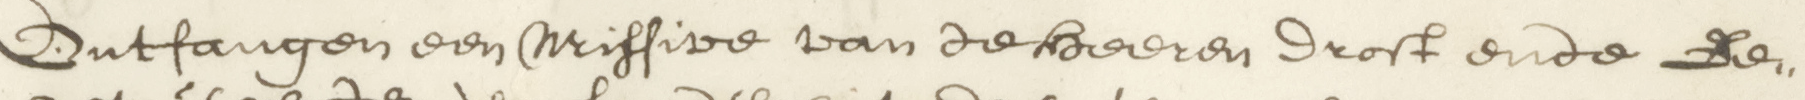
Ontfangen een Missive van de Heeren Drost ende Ge,,
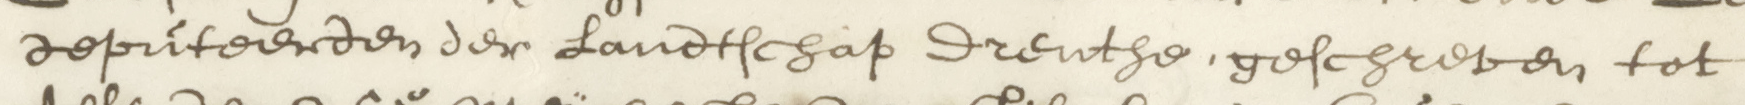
deputeerden der Landtschap Drenthe, geschreven tot
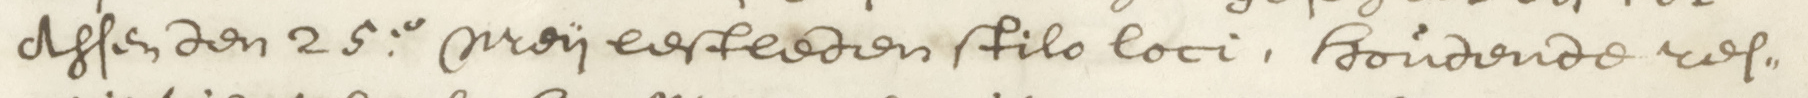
Assen den 25e. Meij lestleden stilo loci, houdende res„
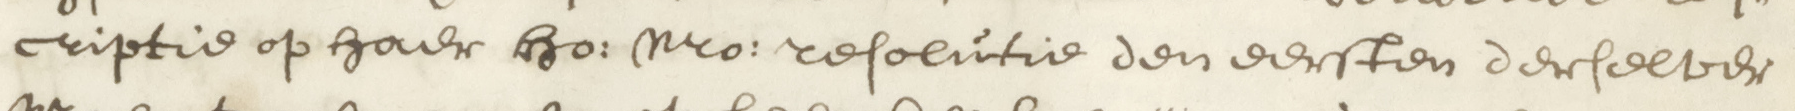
criptie op haer Ho:Mo: resolutie den eersten derselver
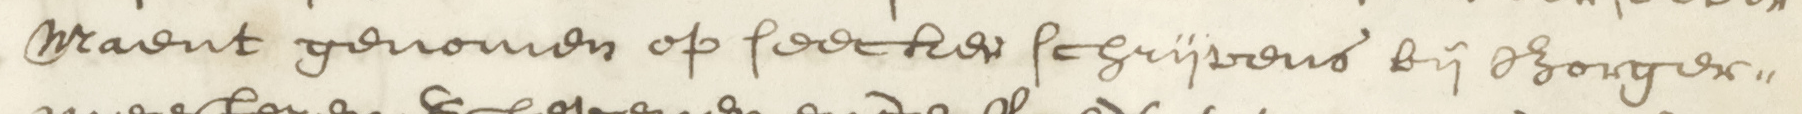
Maent genomen op seecker schrijvens bij Borger,,
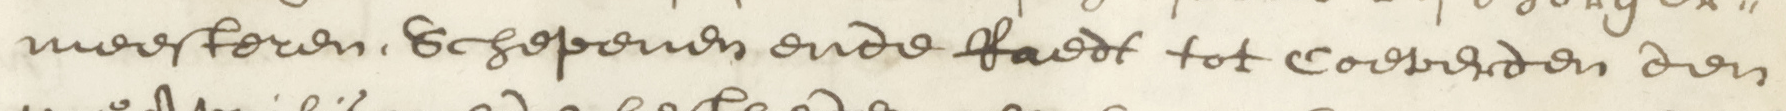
meesteren, Schepenen ende Raedt tot Coeverden den
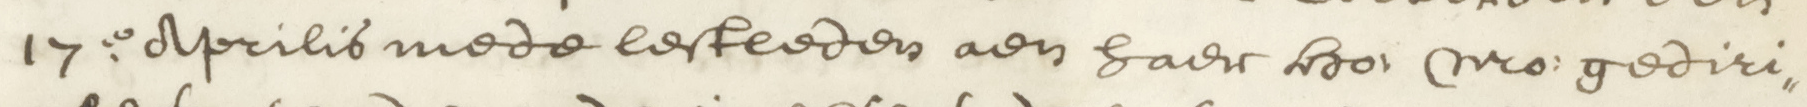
17e Aprilis mede lestleden aen haer Ho:Mo: gediri„
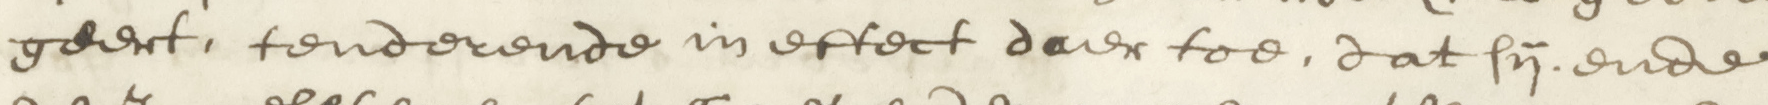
geert, tenderende in effect daer toe, dat sij ende
